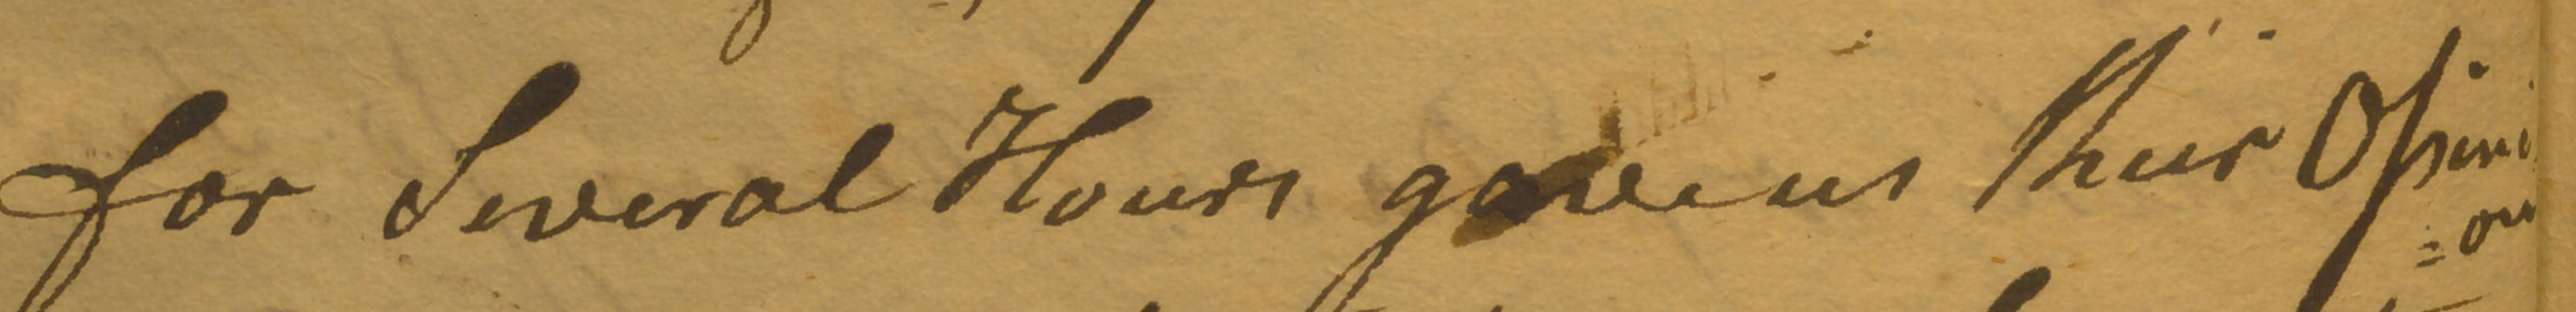for Teveral Hours gave us their Opini
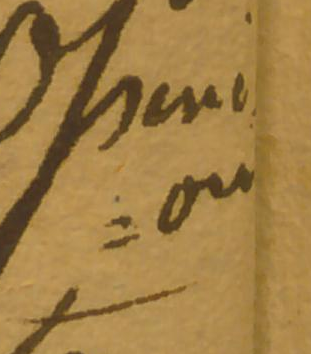-on
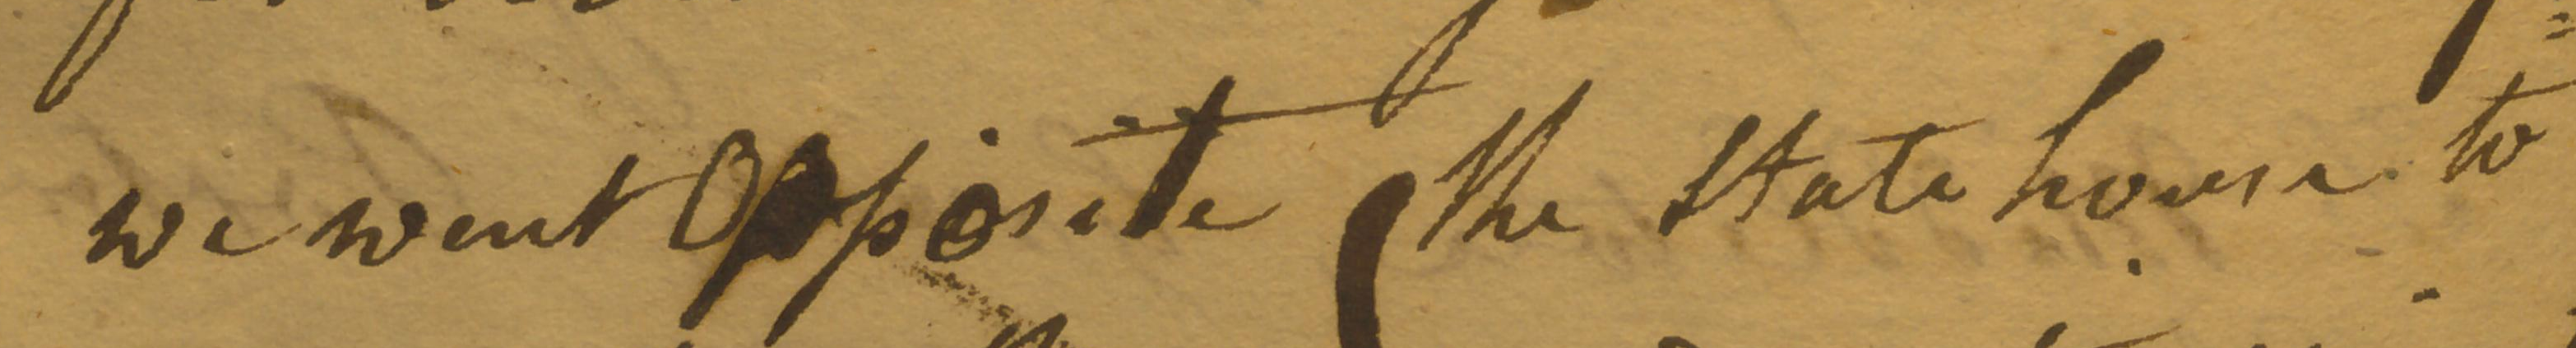we went opposite the State house to
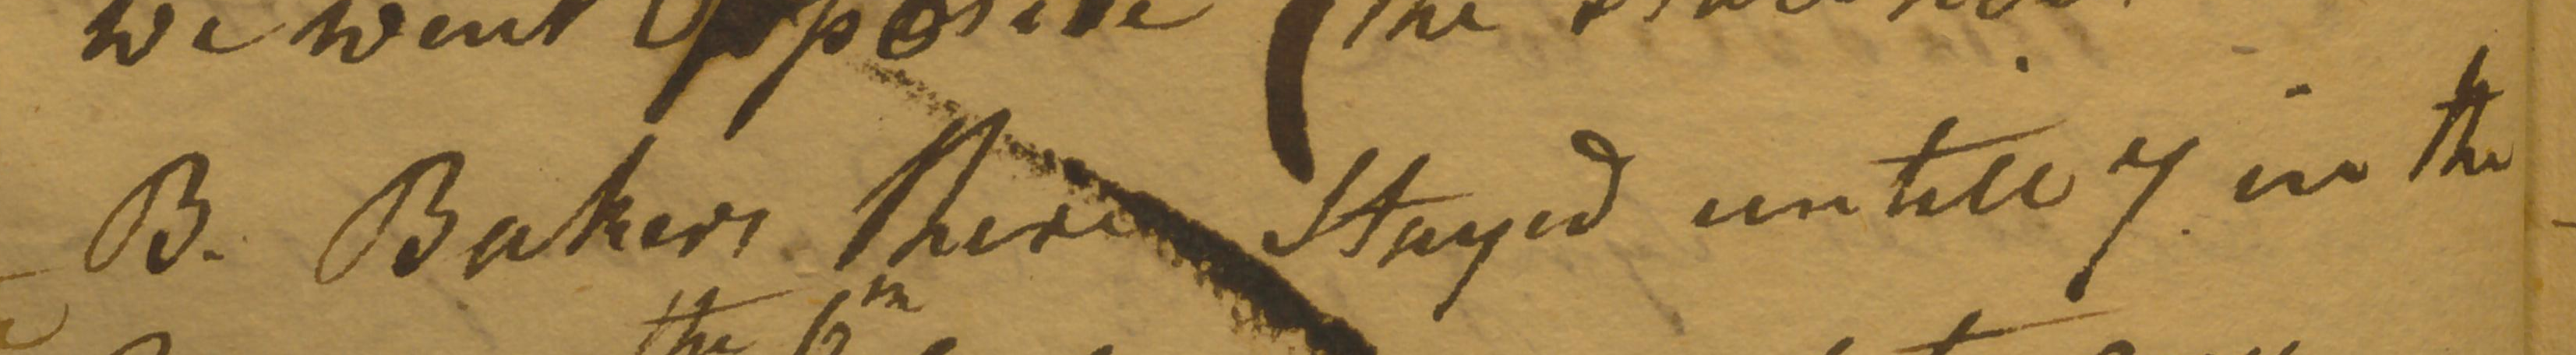B. Bakers there Stayed untill 7 in the
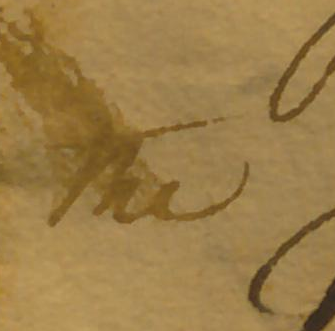the
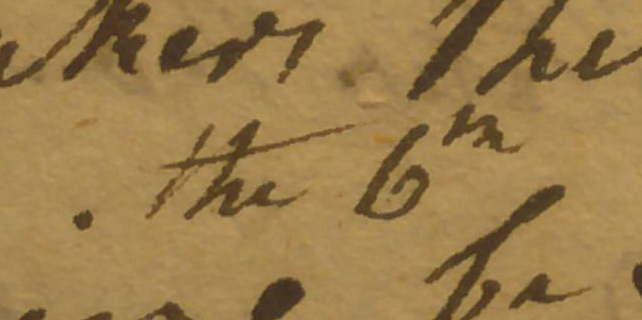the 6^th
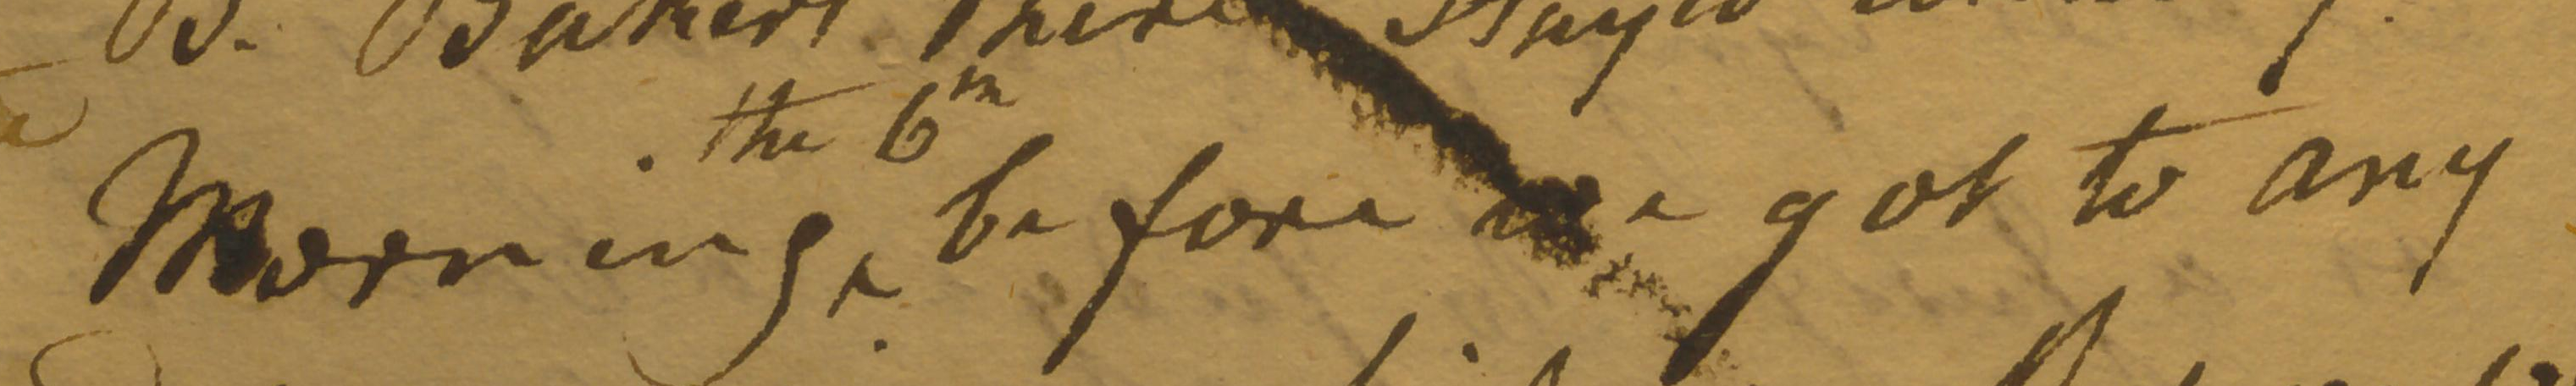Morning, ^ be fore we got to any
